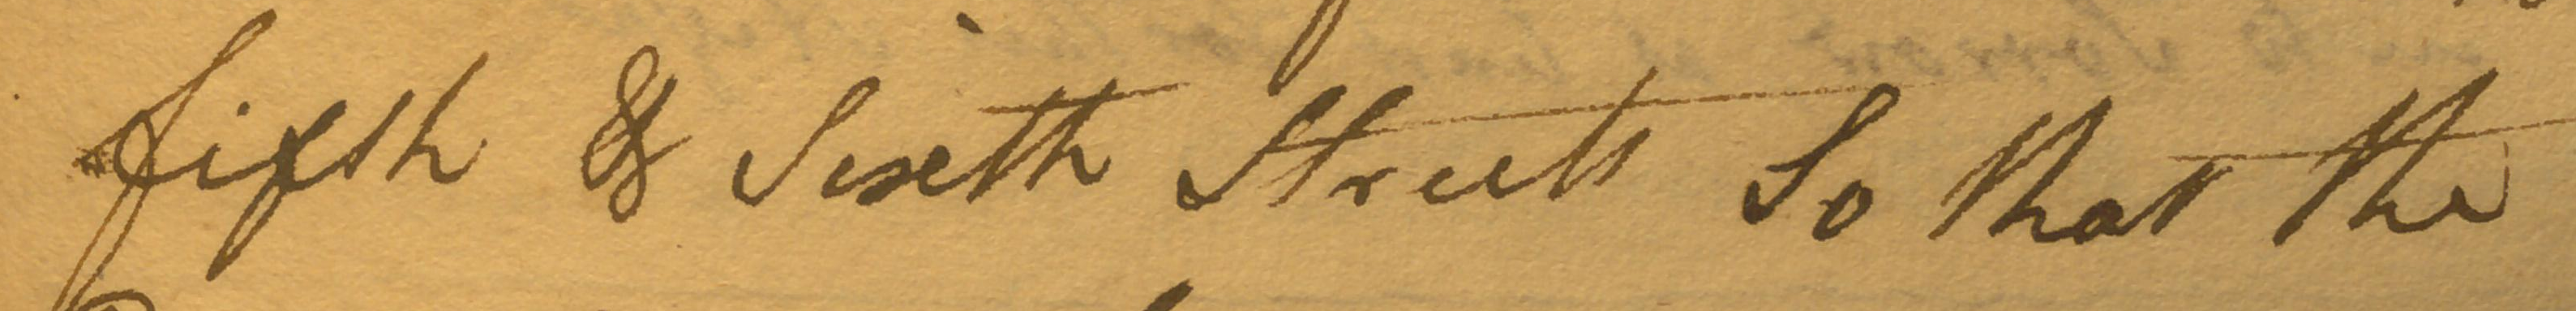fifth & Sixth Streets so that the
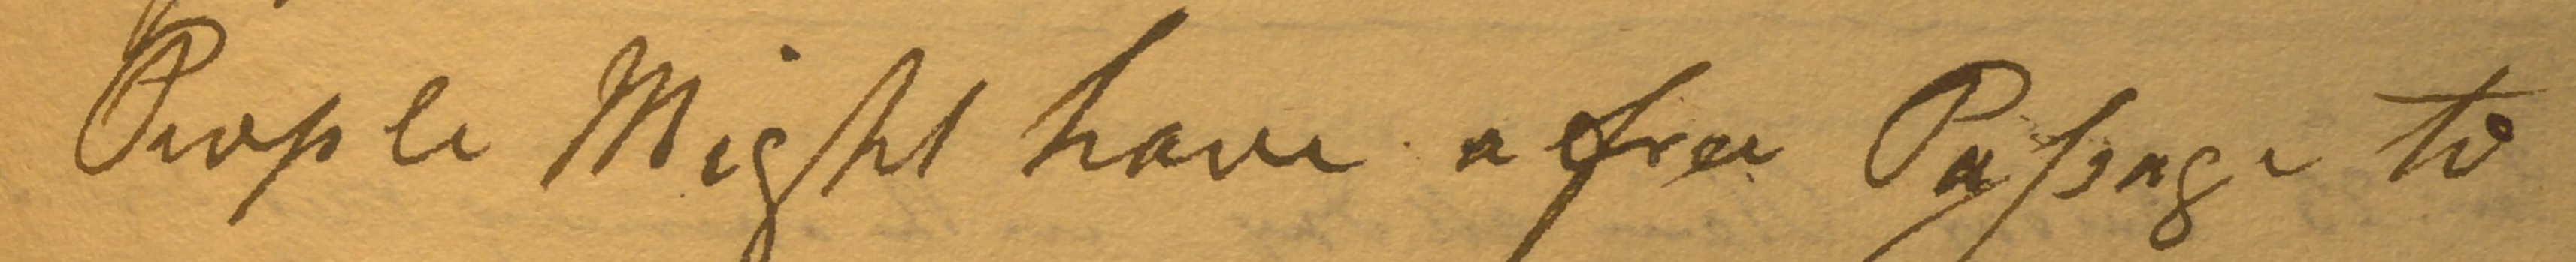People Might have a free Passage to
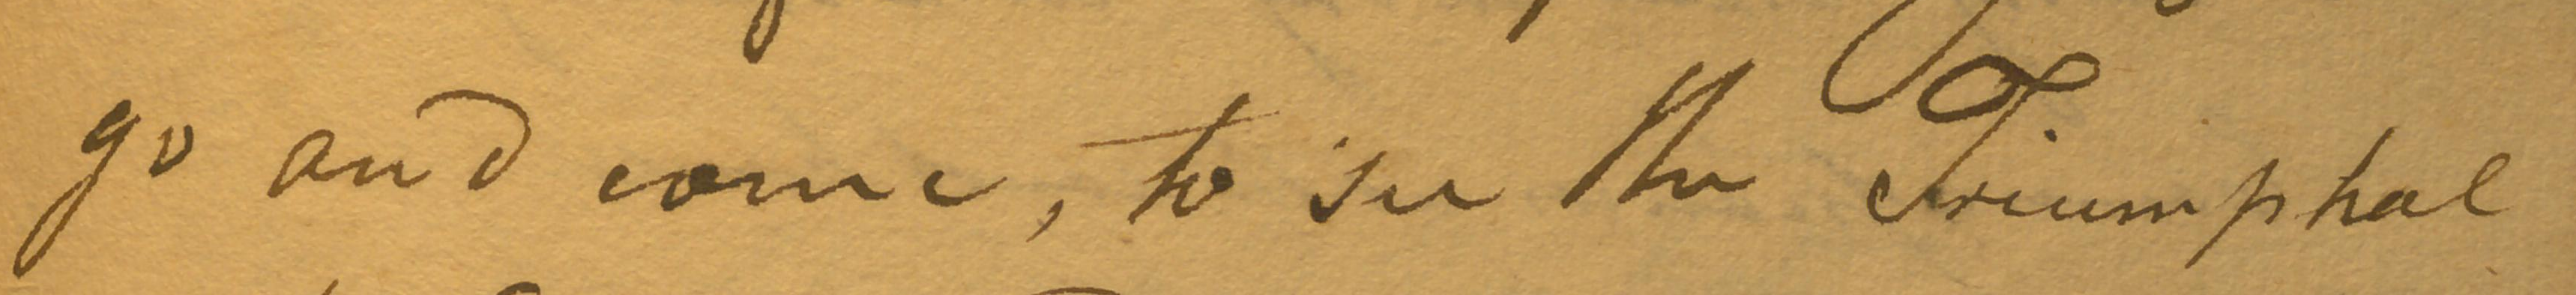go and come, to see the Triumphal
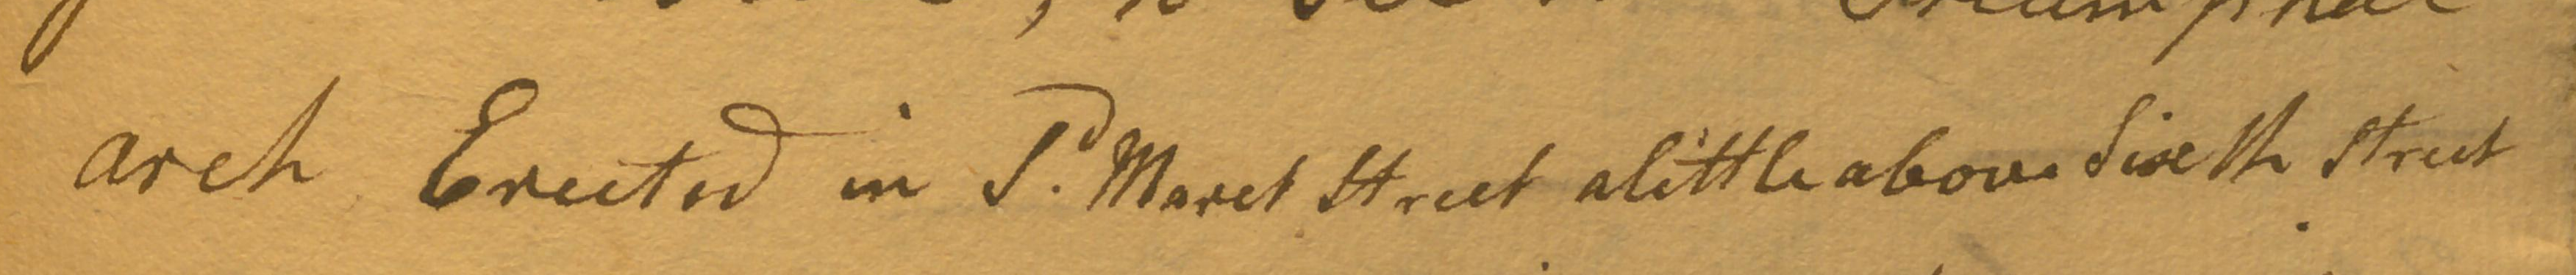Arch Erected in S^d. Maret Street a little above Sixth street
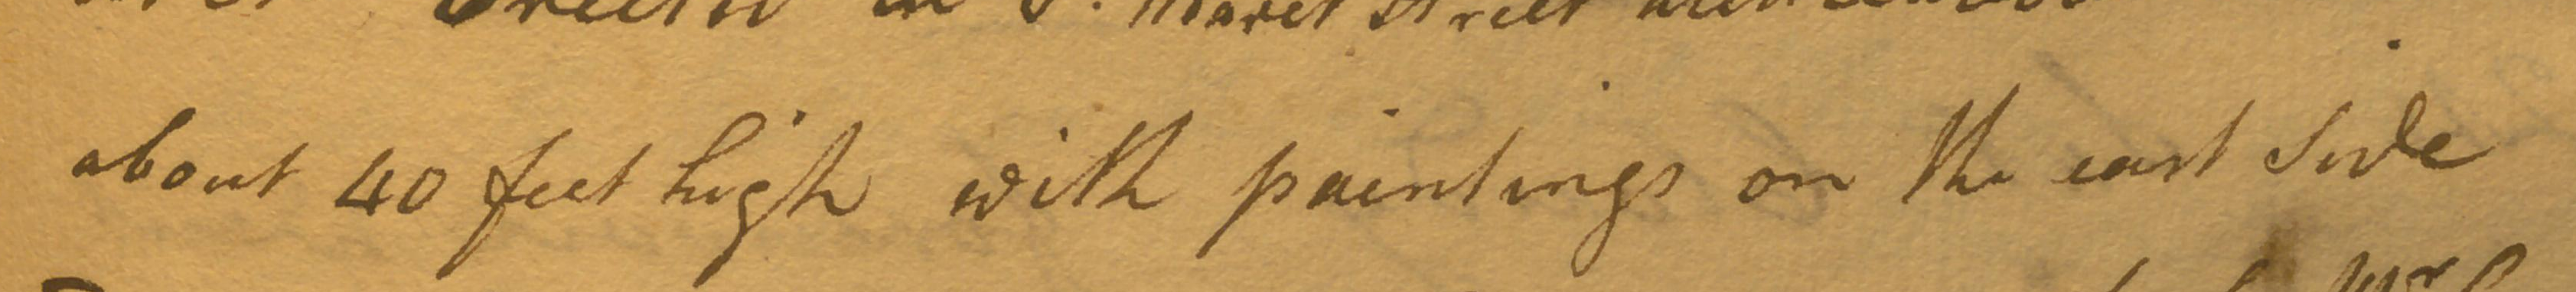about 40 feet high with paintings on the east side
